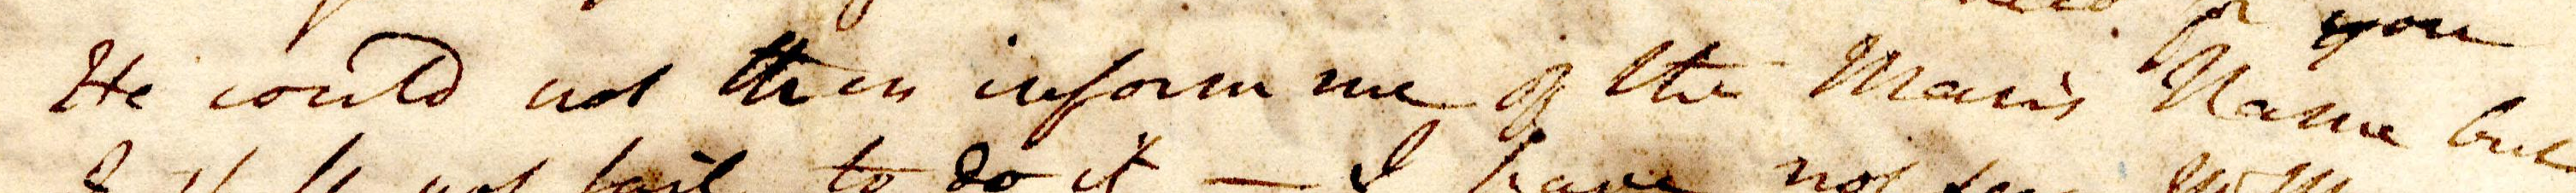He could not then inform me of the Man's Name but
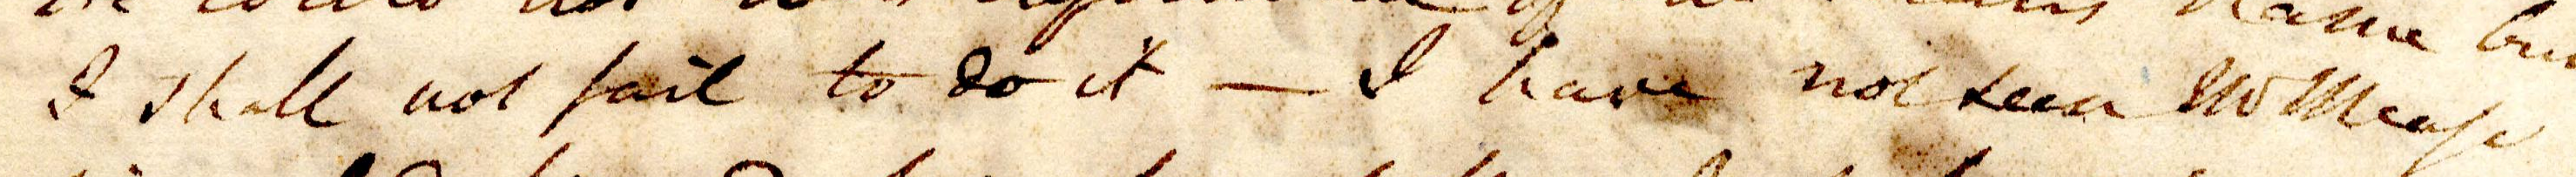I shall not fail to do it. I have not seen W. Mease
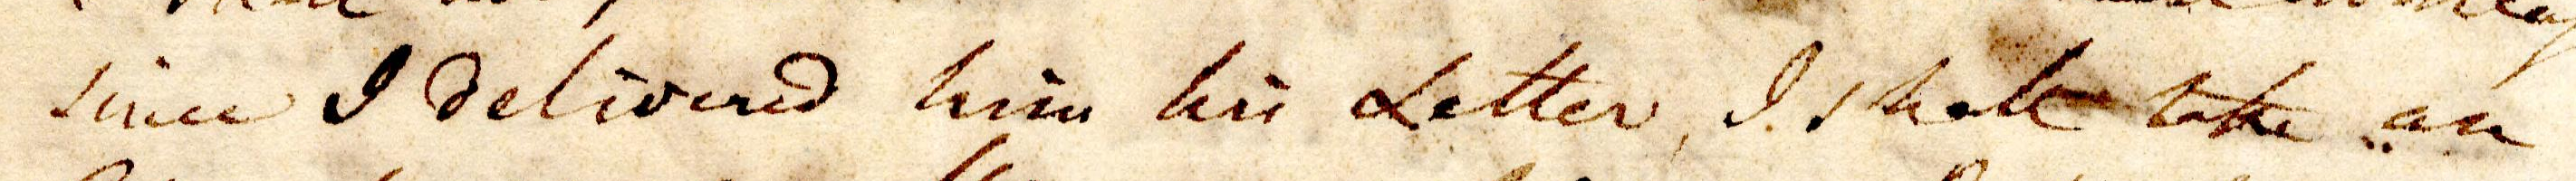since I delivered him his Letter. I shall take an
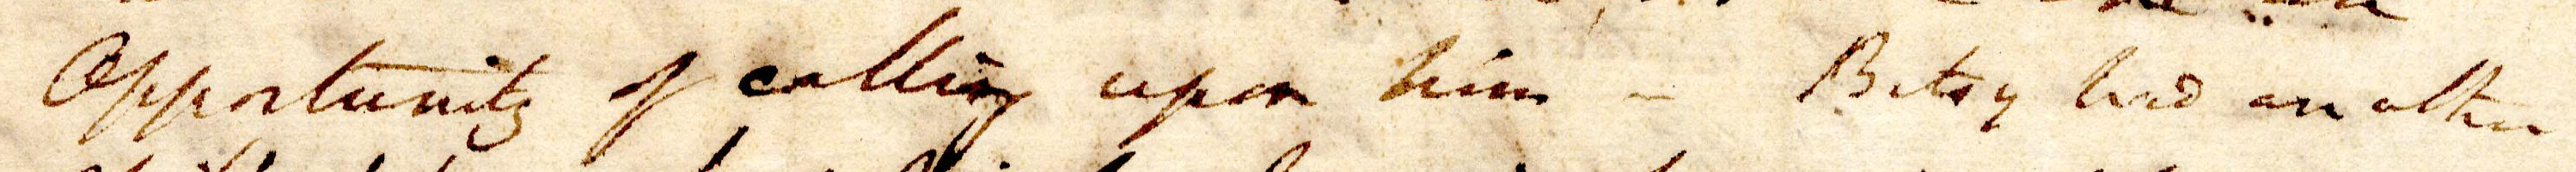Opportunity of calling upon him. Betsy had another
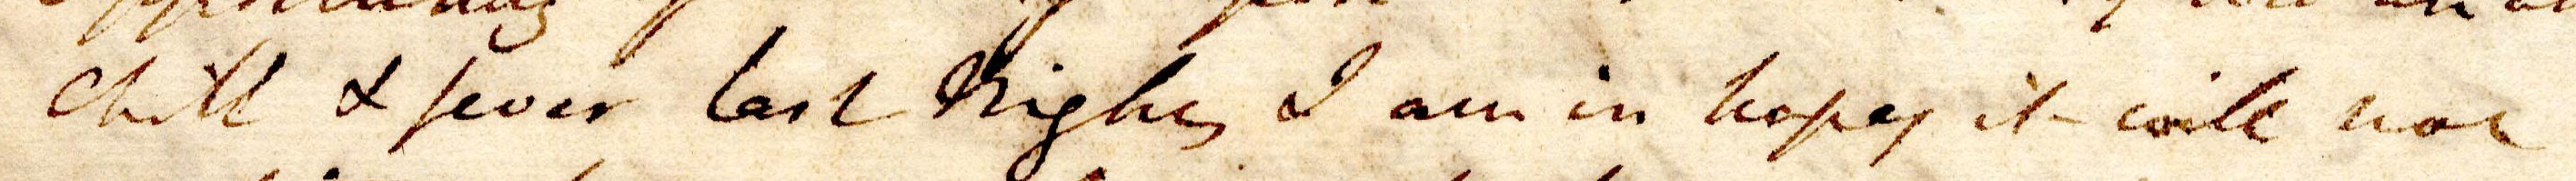Chill & fever last Night. I am in hopes it will not
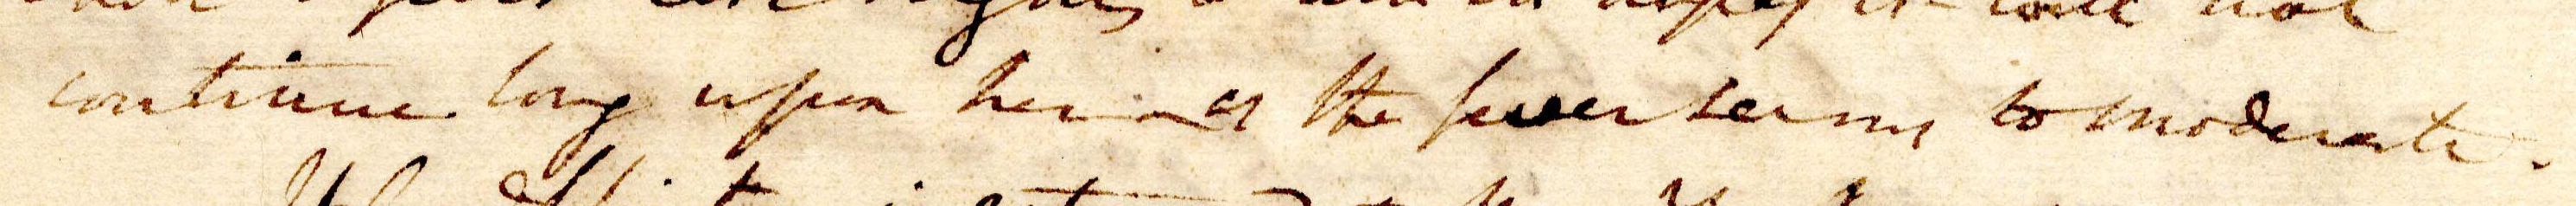continue long upon her- as the fever seems to moderate.
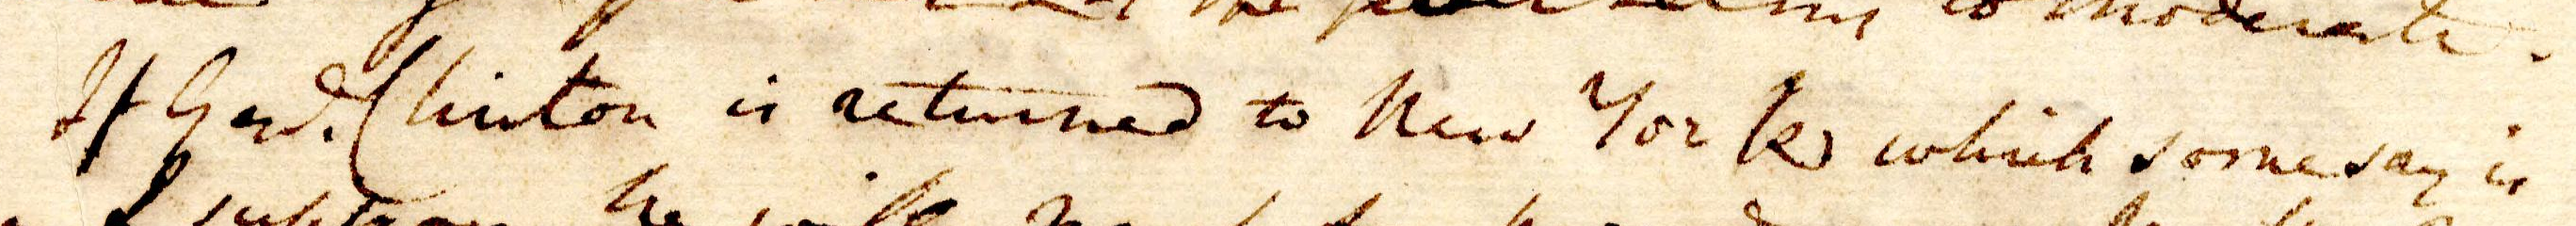If Gen^l. Clinton is returned to New York which some say is
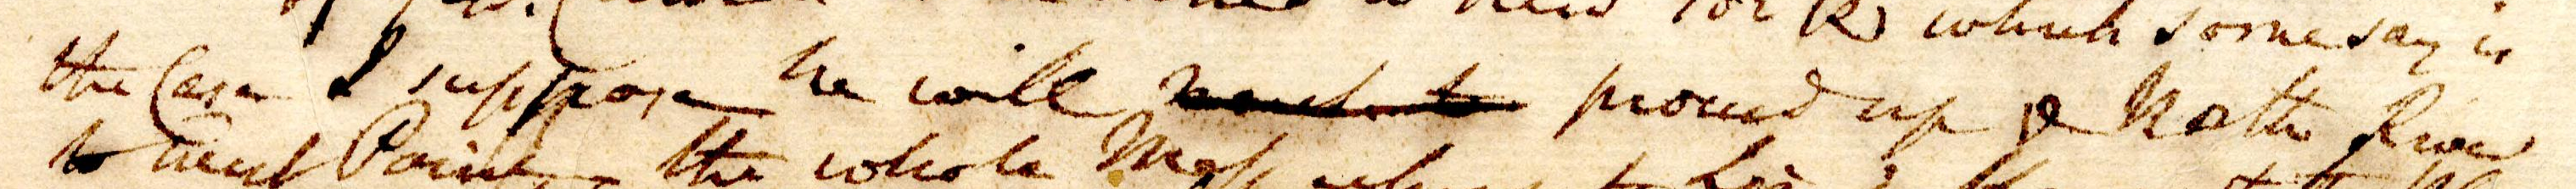the Case I suppose, he will next to proceed up y^e North River
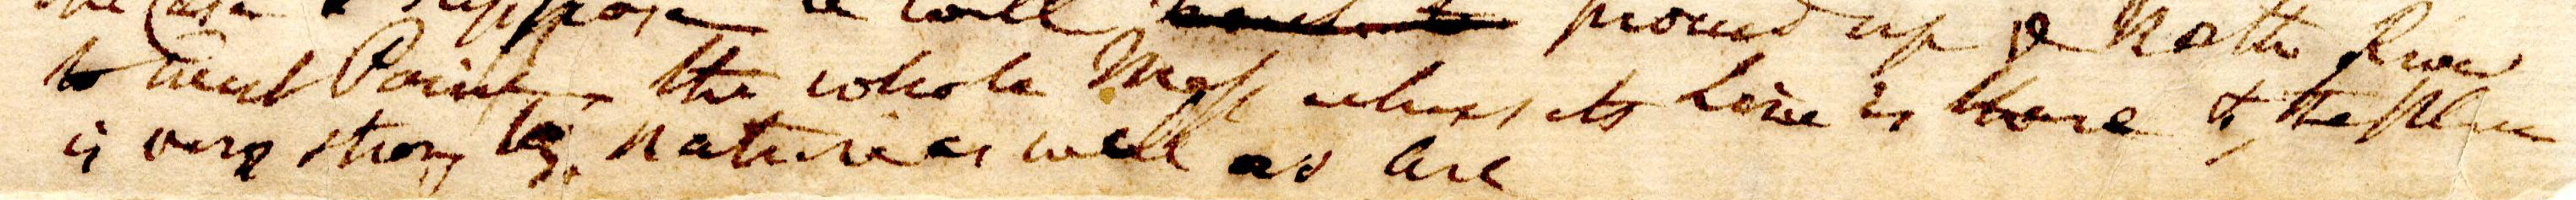to next Point. the whole Mass relurs its love is there & the Place
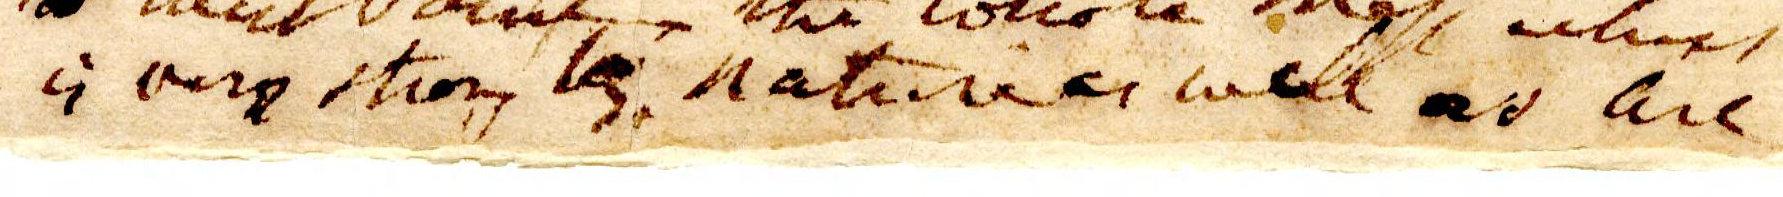is very strong by nature as well as are
